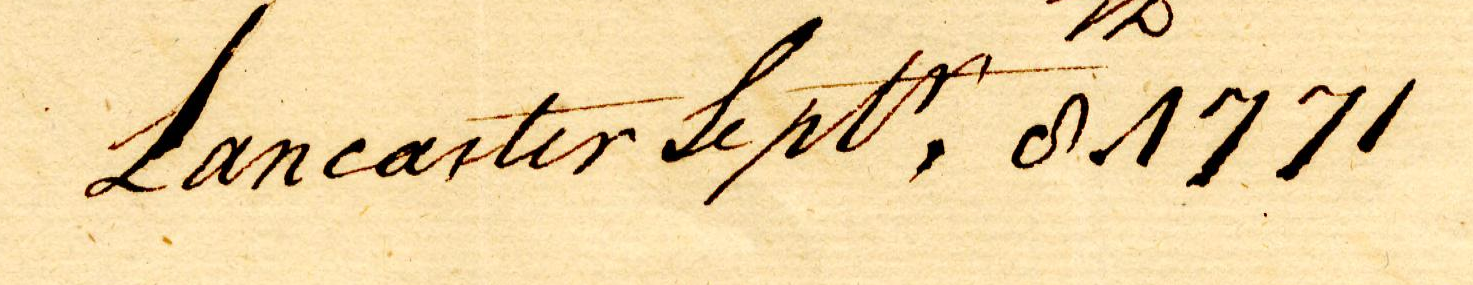Lancaster Sept^r. 8^th 1771
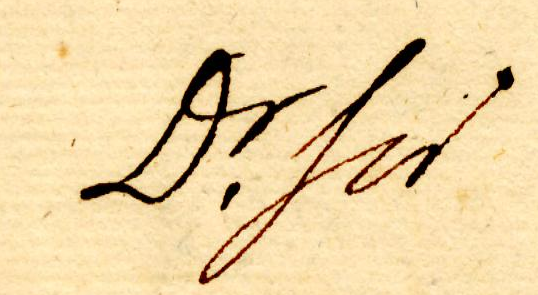D^r. Sir
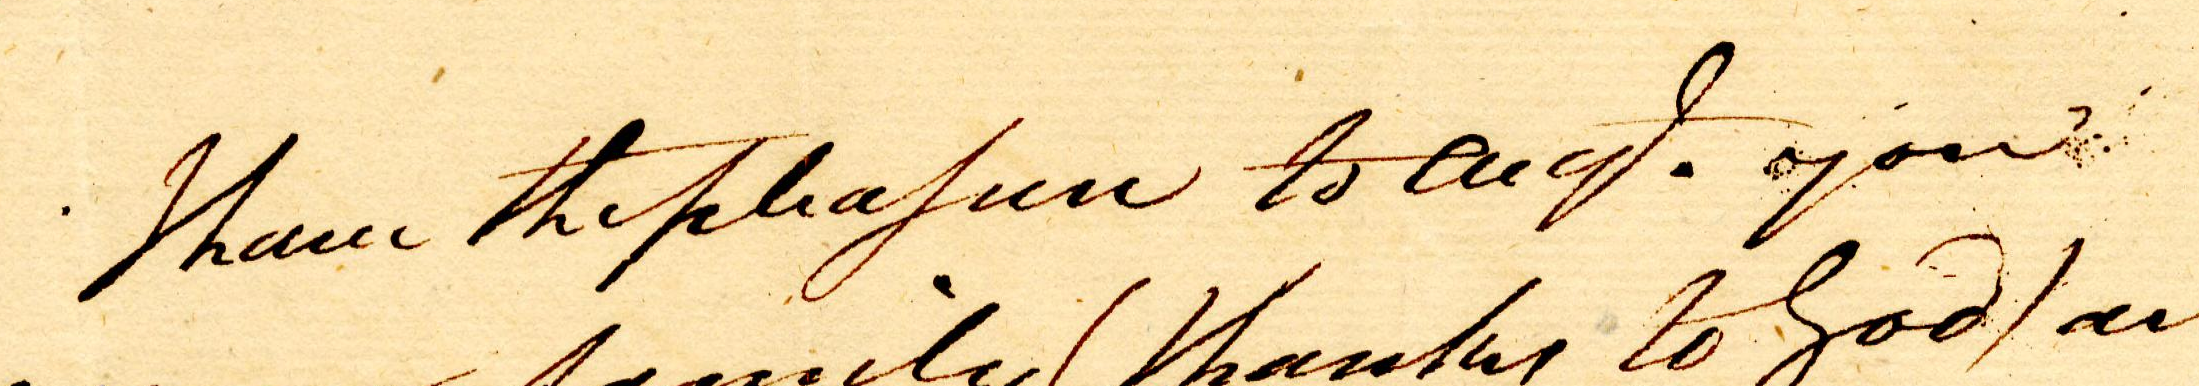I have the pleasure to acq^t. you
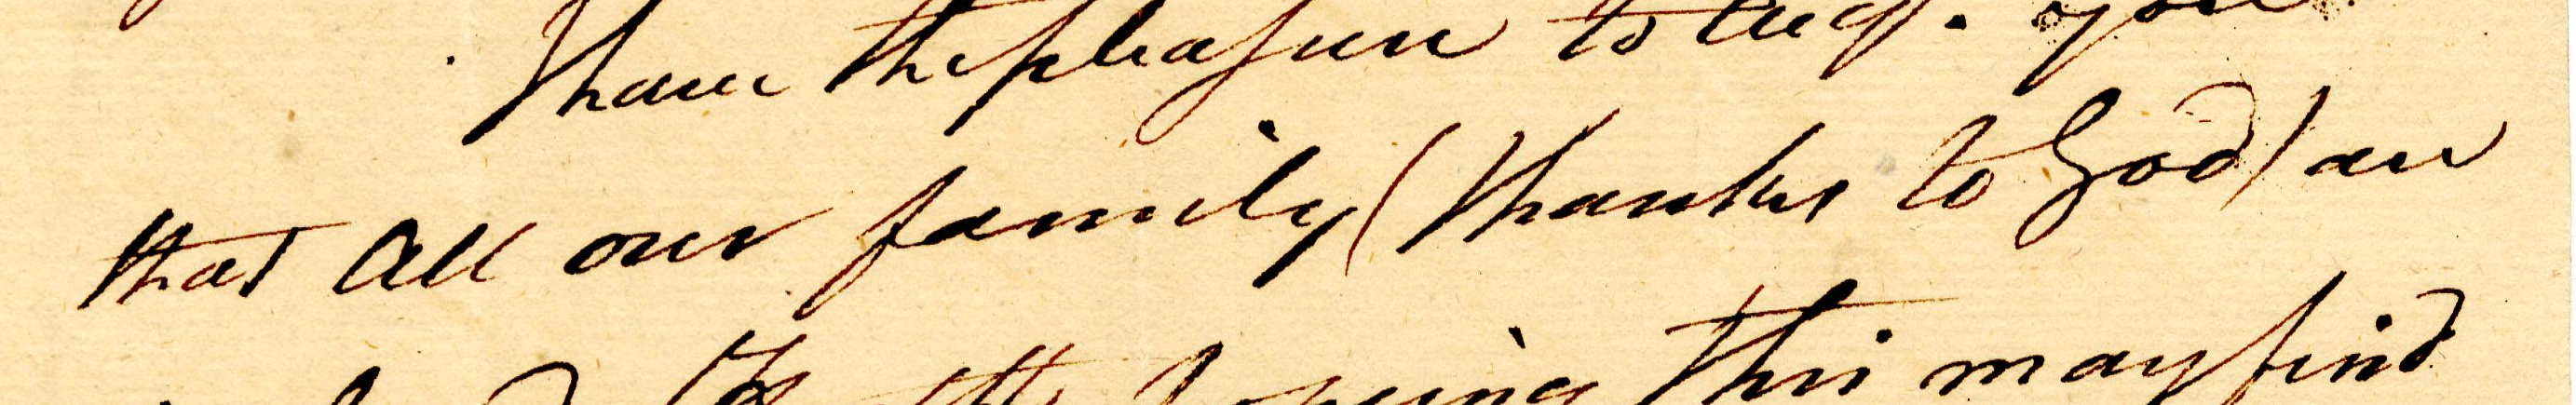that all our family (thanks to God) are
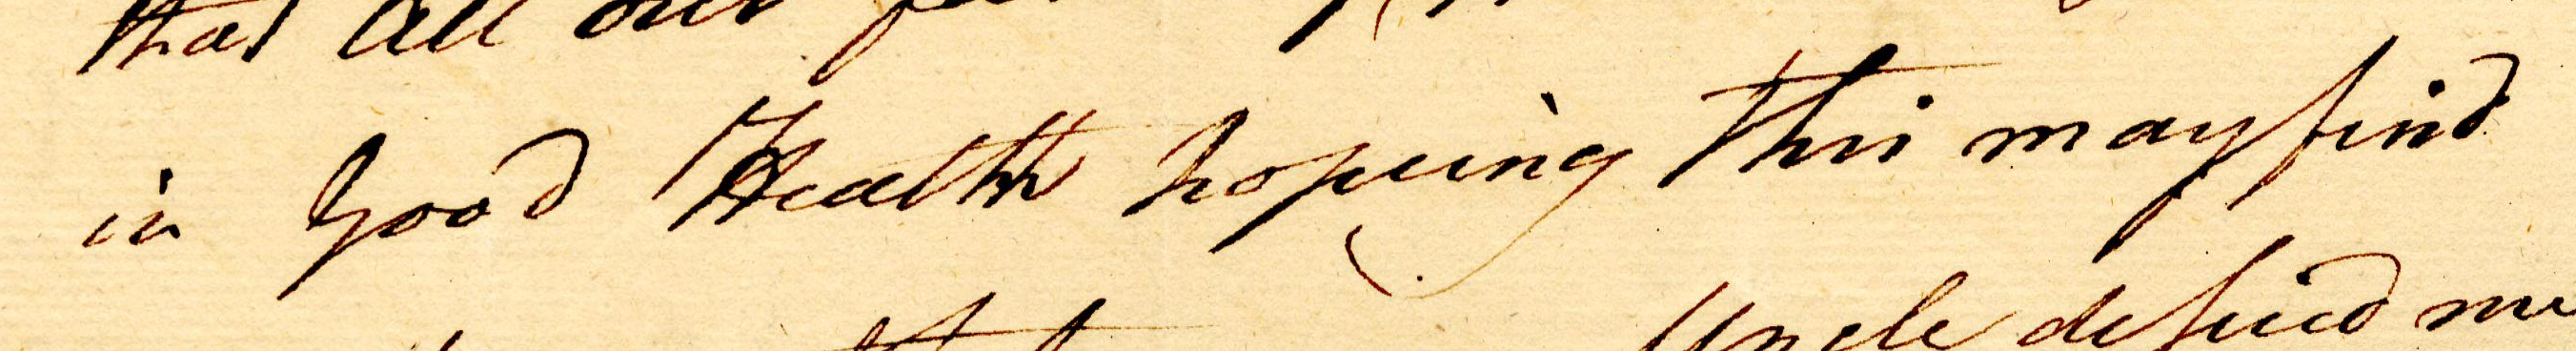in Good Health hopeing this may find
